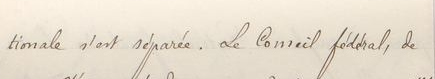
tionale s'est séparée. Le Conseil fédéral, de
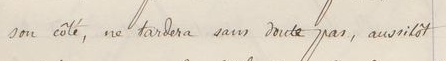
son côté, ne tardera sans doute pas, aussitôt
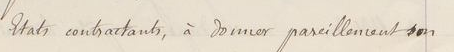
Etats contractants, à donner pareillement son
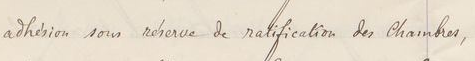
adhésion sous réserve de ratification des Chambres,
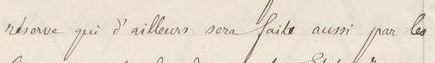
réserve qui d'ailleurs sera fait aussi par les
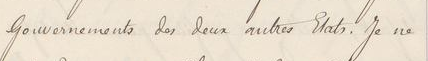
Gouvernements des deux autres Etats. Je ne
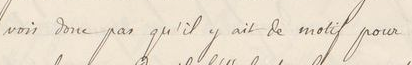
vois donc pas qu'il y ait de motif pour
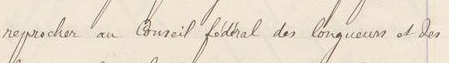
reprocher au Conseil fédéral des longueurs et des
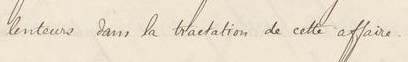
lenteurs dans la tractation de cette affaire.
